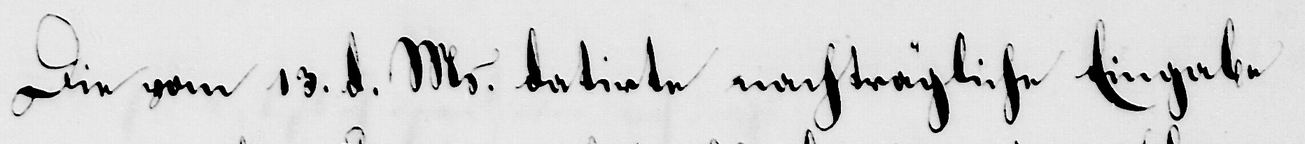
Die vom 13. d. Ms. datirte nachträgliche Eingabe
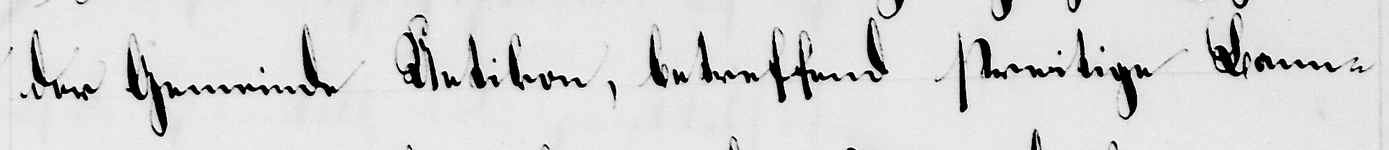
der Gemeinde Uetikon, betreffend streitige Bann¬
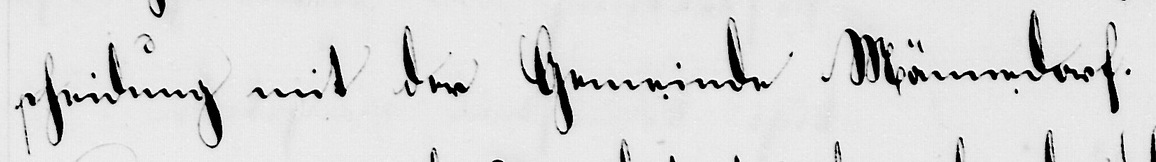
scheidung mit der Gemeinde Männedorf.
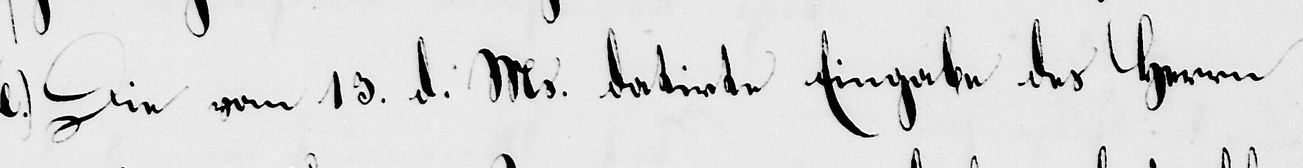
Die vom 13. d. Ms. datirte Eingabe des Herrn
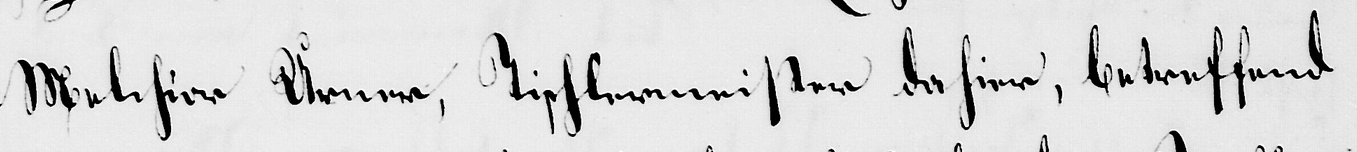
Melchior Urner, Tischlermeister dahier, betreffend
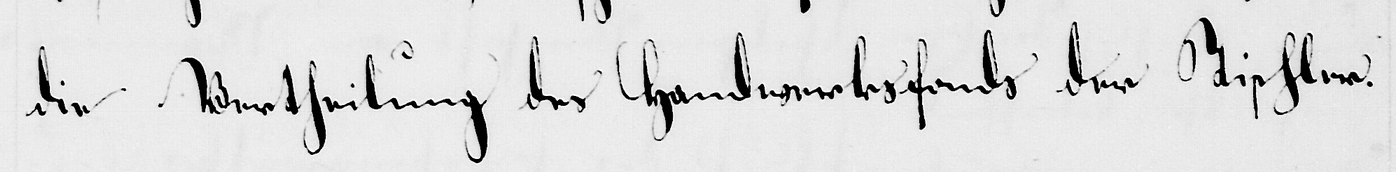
die Vertheilung des Handwerksfonds der Tischler.
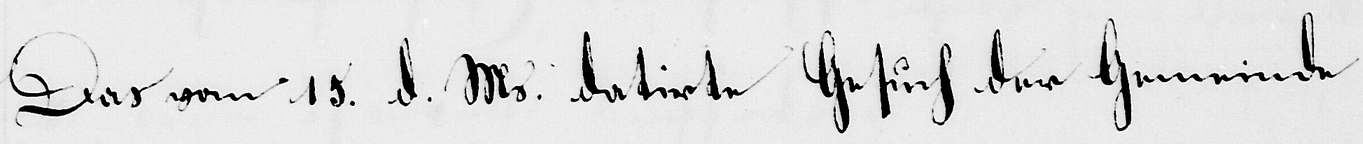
Das vom 15. d. Ms. datirte Gesuch der Gemeinde
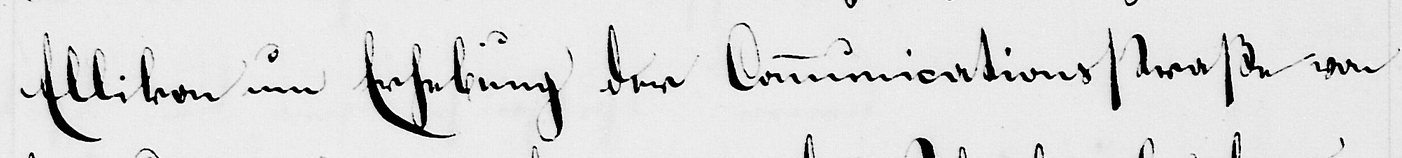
Ellikon um Erhebung der Communicationsstraße von
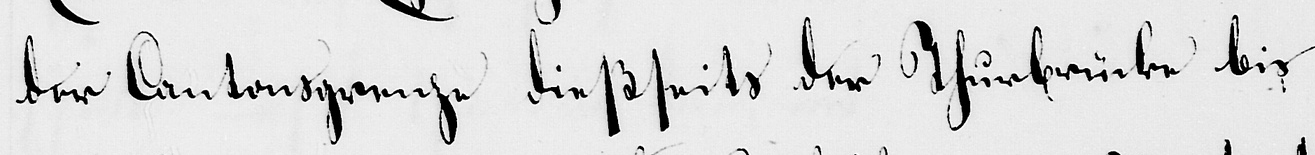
der Cantonsgrenze dießseits der Thurbrücke bis
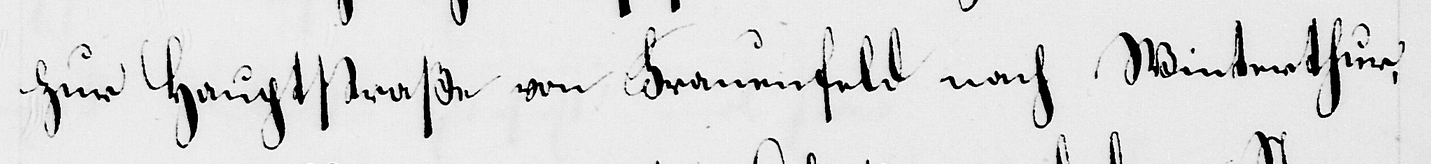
zur Hauptstraße von Frauenfeld nach Winterthur,
